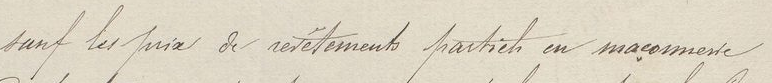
sauf les prix de revêtements partiels en maçonnerie
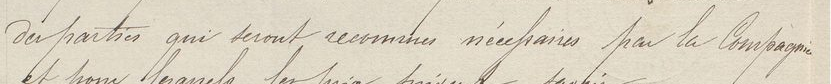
des parties qui seront reconnues nécessaires par la Compagnie
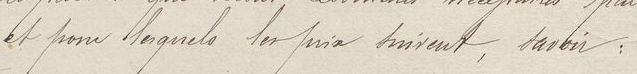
et pour lesquels les prix suivent, savoir:
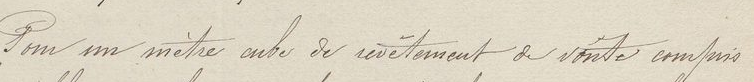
Pour un mètre cube de revêtement de voûte compris
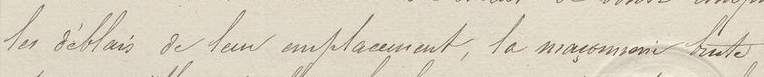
les déblais de leur emplacement, la maçonnerie brute
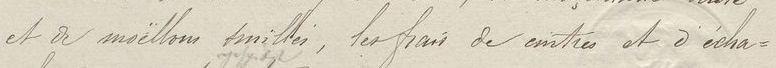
et de moëllons smillés les frais de cintres et d'écha-
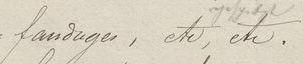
faudage, etc, etc.
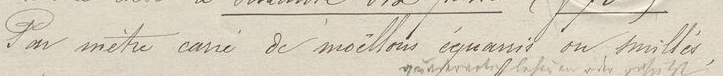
Par mètre carré de moëllons équarris ou smillés,
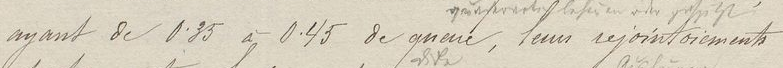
ayant de 0.35 à 0.45 de queue , leurs rejointoiements
